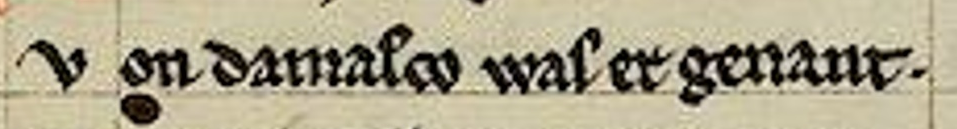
Von damaſco waſ er genant.
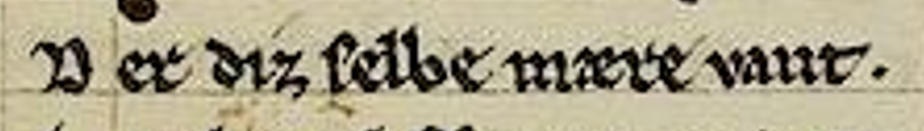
Der diz ſelbe m[ae]re vant.
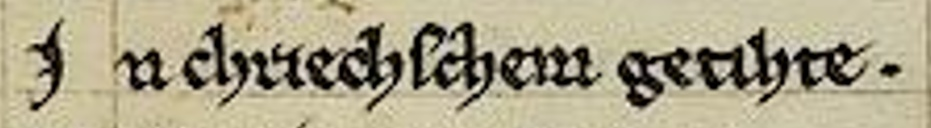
In chriechſchem getihte.
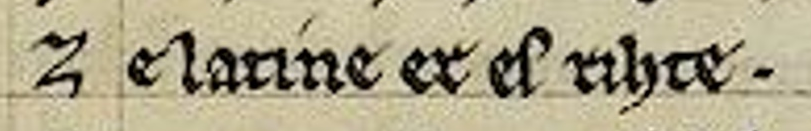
Ze latine er eſ rihte.
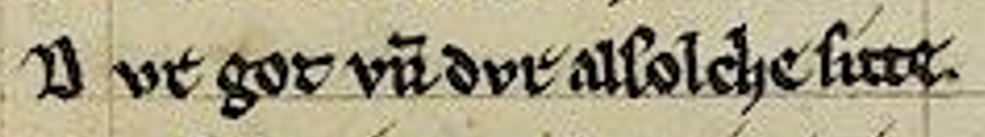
Dvr got vn(d) dvr alſolche ſitte.
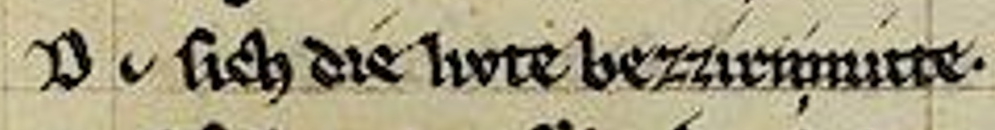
D(az) ſich die livte bezzirnmitte.
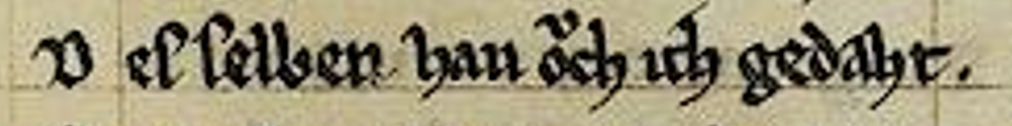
Deſ ſelben han o°vch ich gedaht.
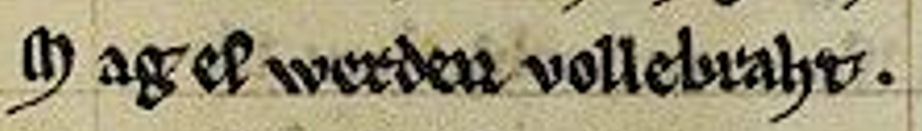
Mag eſ werden vollebraht.
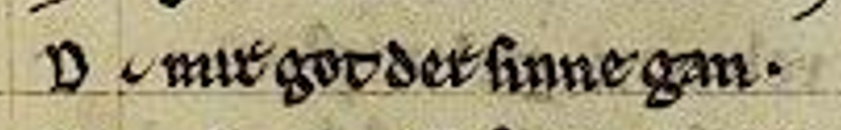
D(az) mir got der ſinne gan.
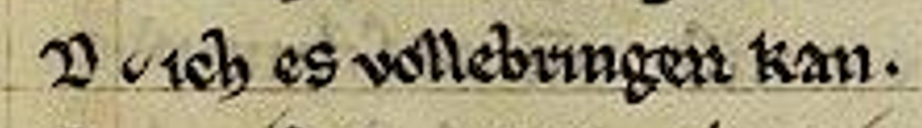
D(az) ich es vollebringen kan.
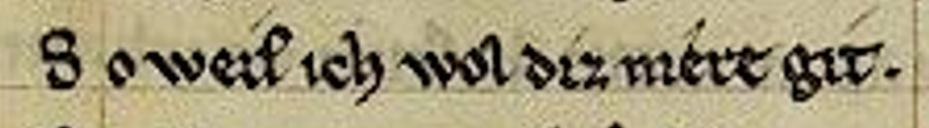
So weiſ ich wol diz mere git.
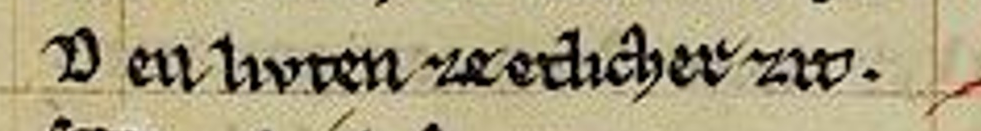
Den livten ze etlicher zit.
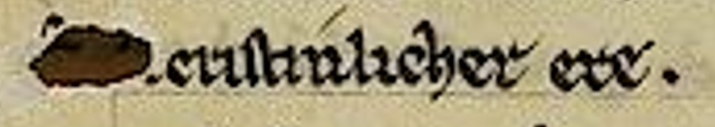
xxx criſtinlicher ere.
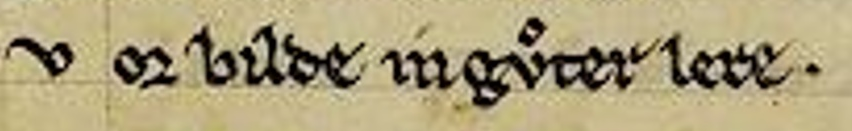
Vor bilde in gv°oter lere.
